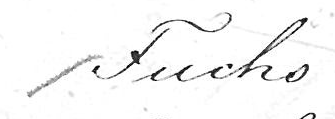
Fuchs
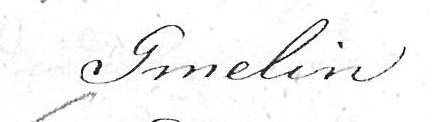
Gmelin
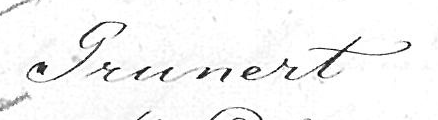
Grunert
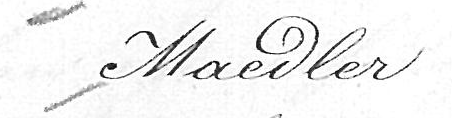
Maedler
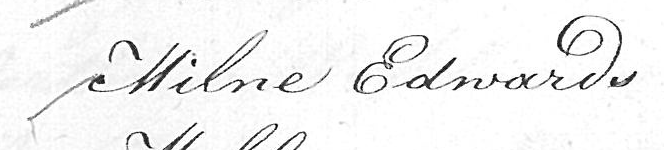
Milne Edwards
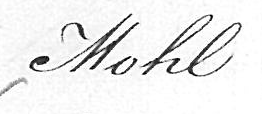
Mohl
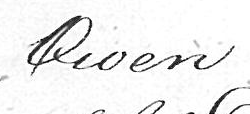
Owen
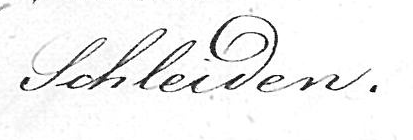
Schleiden
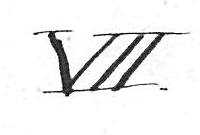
VII.
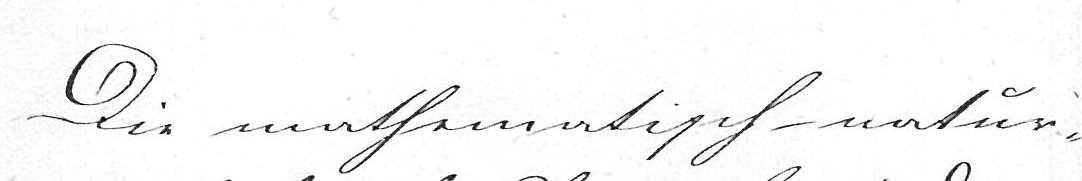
Die mathematisch- natur-
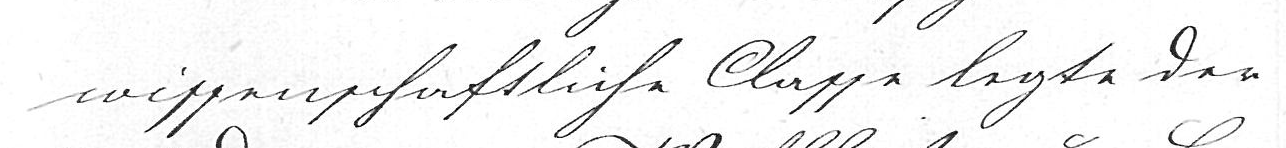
wissenschaftliche Classe legte der
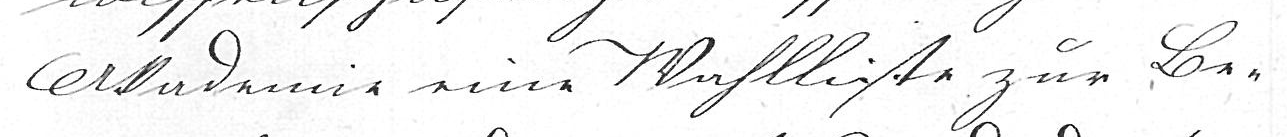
Akademie eine Wahlliste zur Be-
